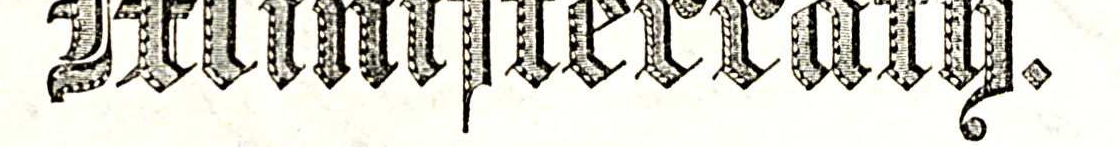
Ministerrath.
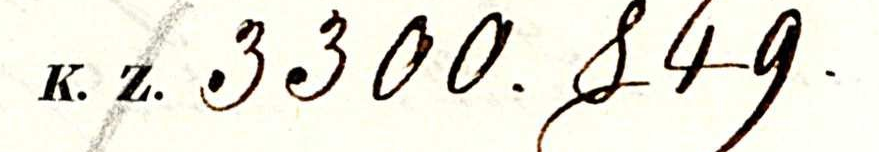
K. Z. 3300. 849.
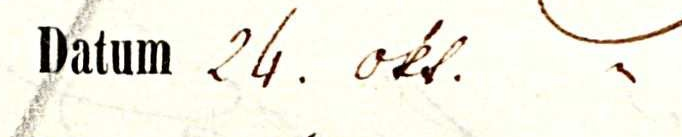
Datum 24. Okt. 849
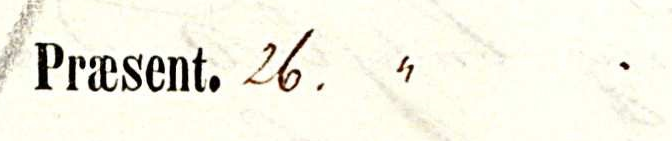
Præsent. 26. Okt. 849
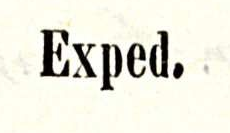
Exped.
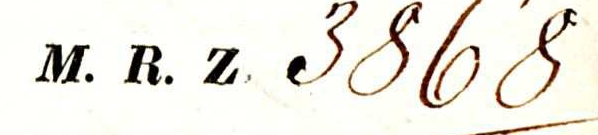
M. R. Z. 3868
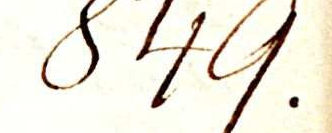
849.
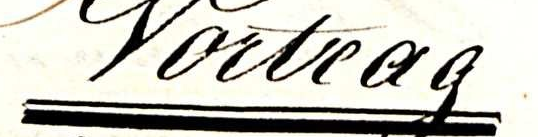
Vortrag
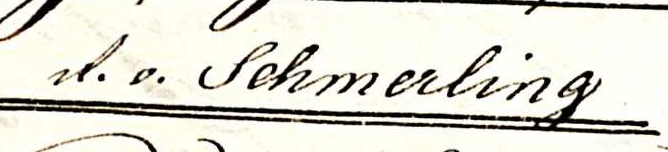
R. v. Schmerling
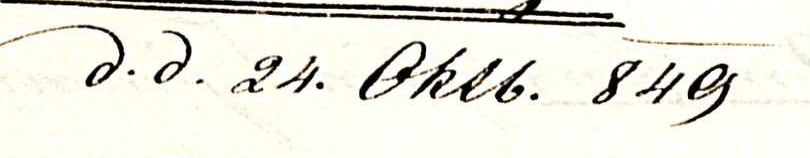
d. d. 24. Oktb. 849
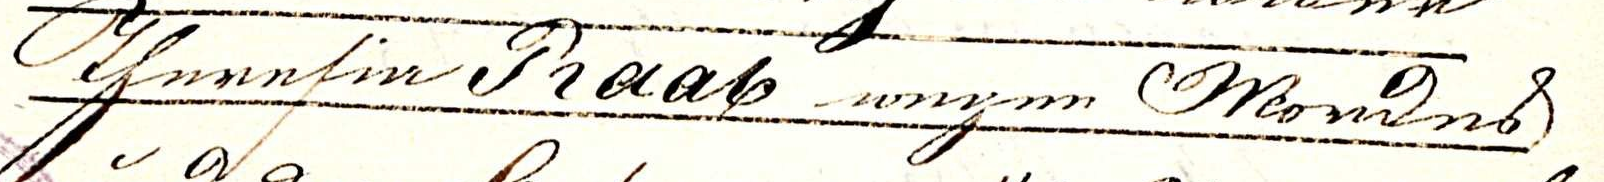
Theresia Raab wegen Mordes
